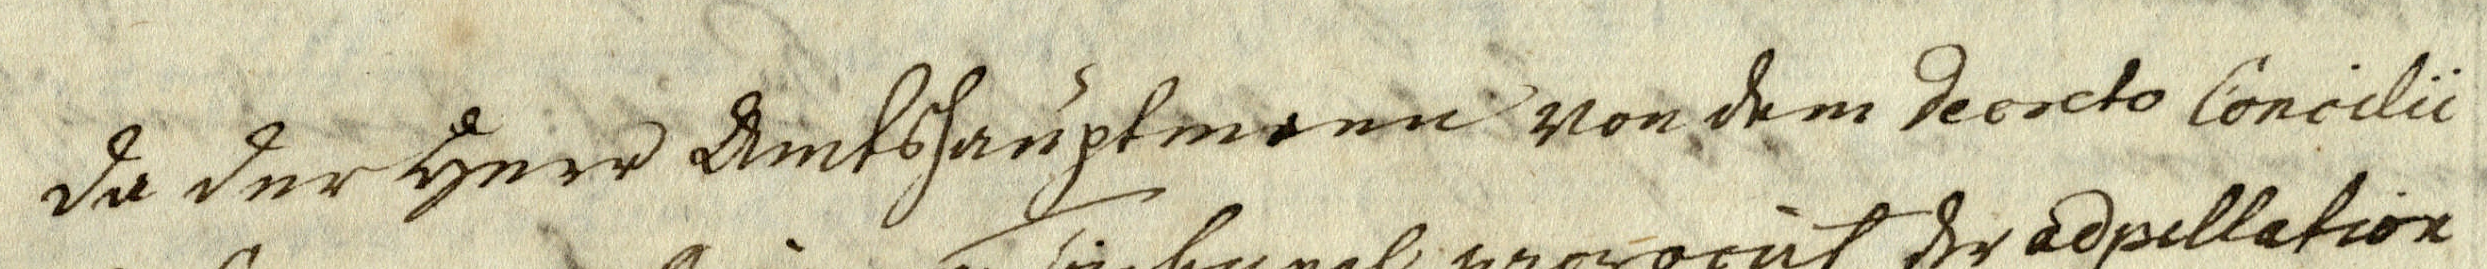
Da der Herr Amtshauptmann von dem Decreto Concilii
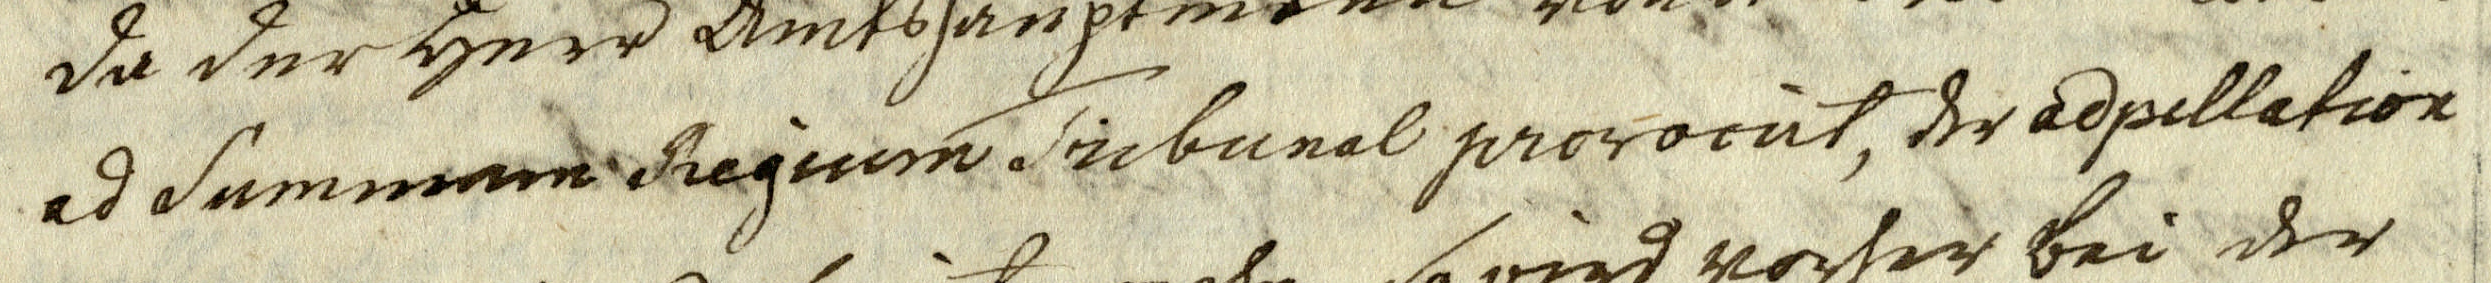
ad Summam Regium Tribunal provocirt, der adpellation
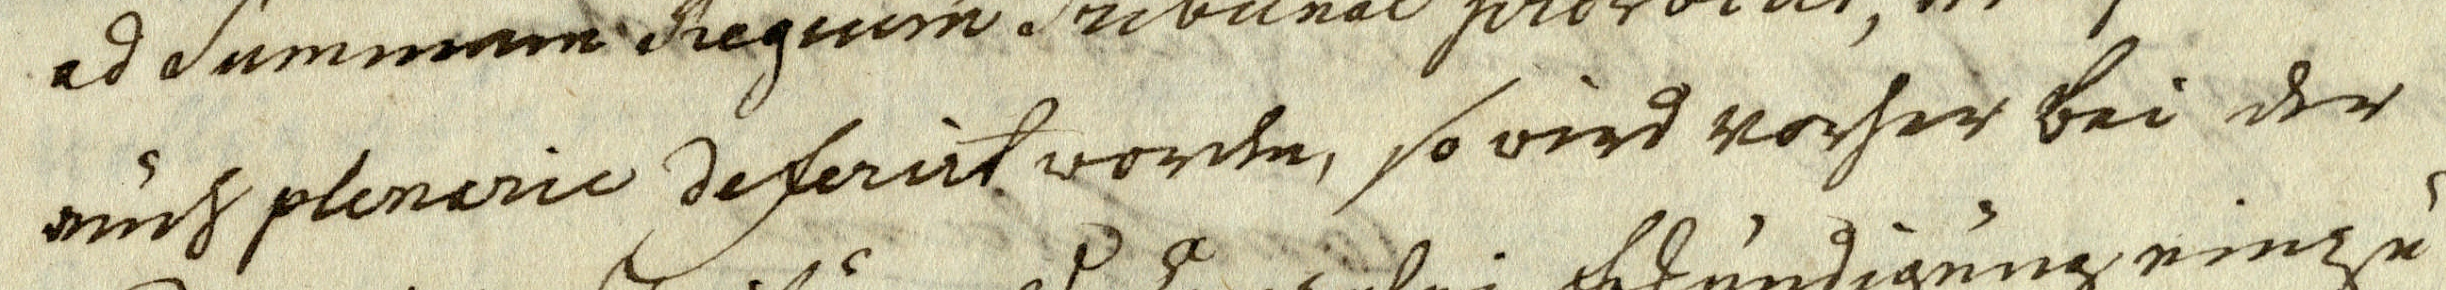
auch plenarie deferirt worden, so wird vorher bei der
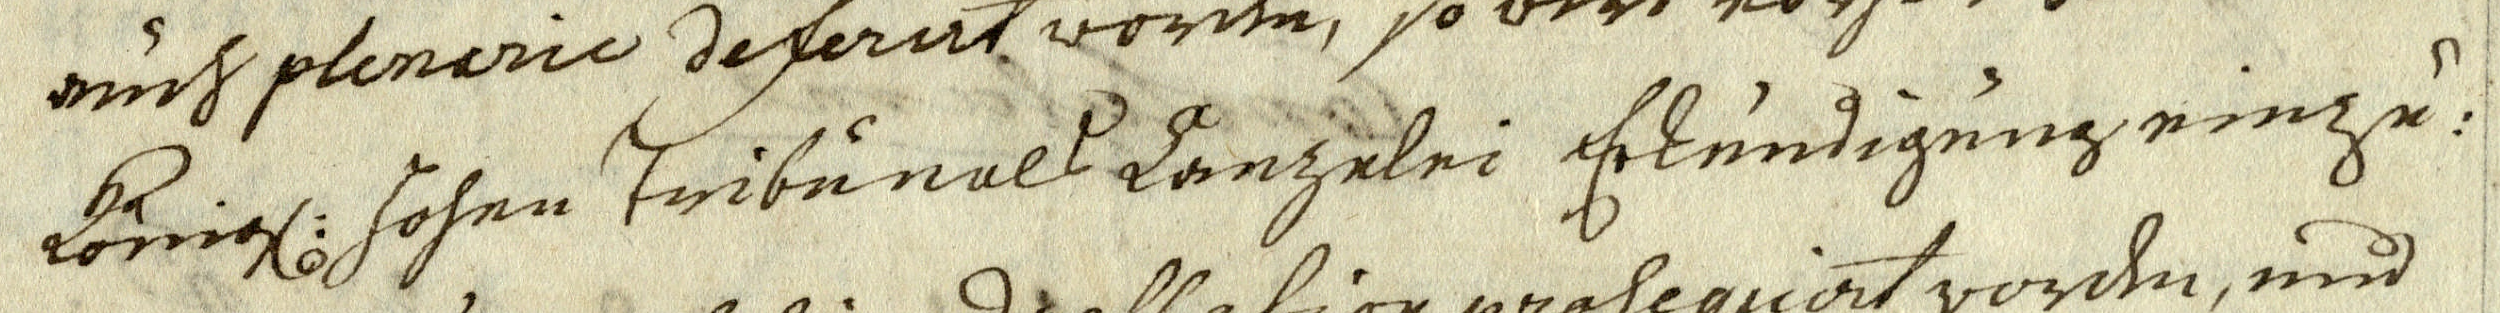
Königl. Hohen Tribunals Canzelei Erkundigung einzu¬
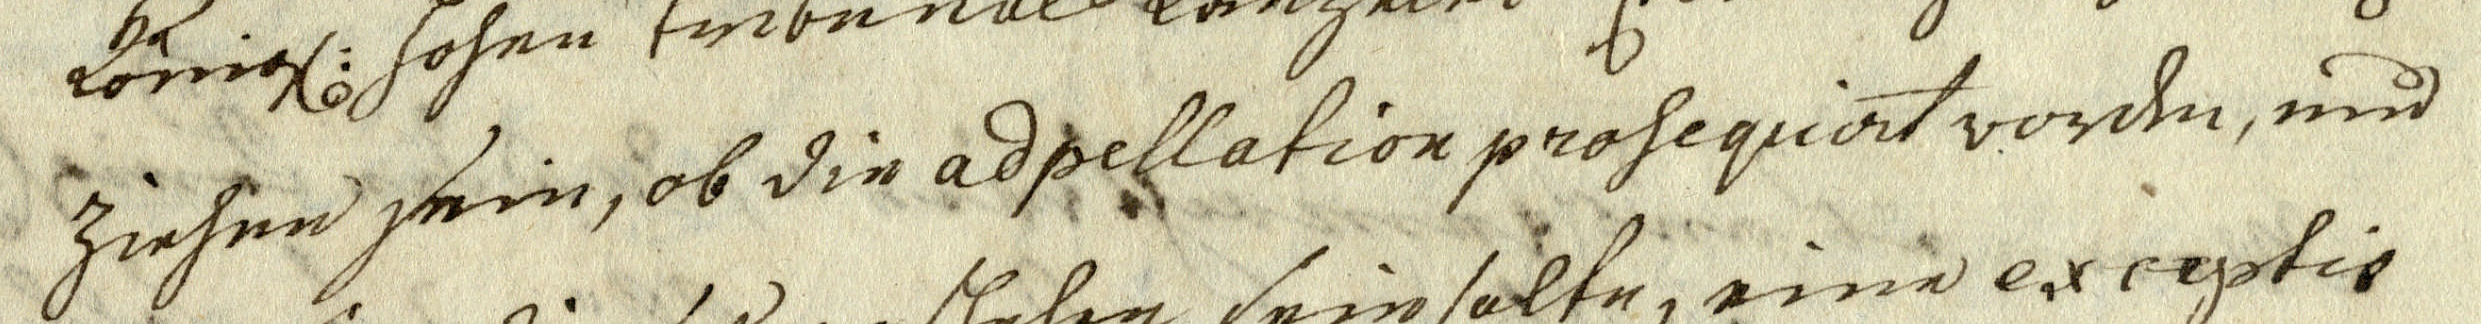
ziehen sein, ob die adpellation prosequirt worden, und
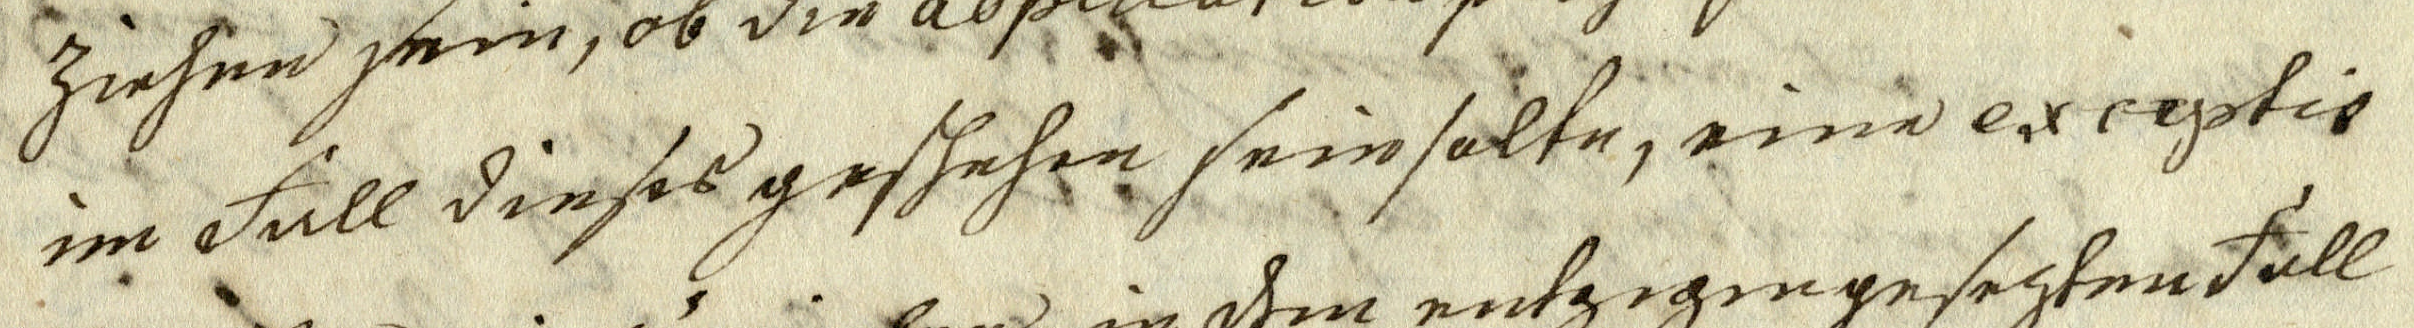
im Fall dieses geschehen sein solte, eine ex ceptis
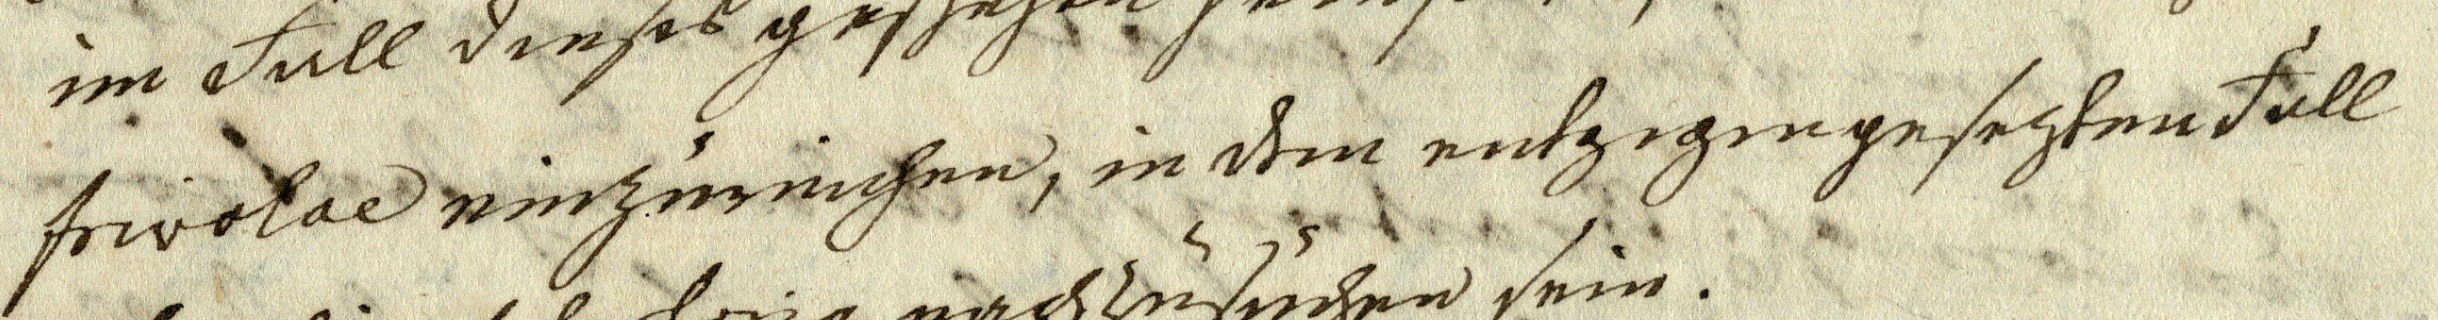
frivolae einzureichen, in dem entgegengesezten Fall
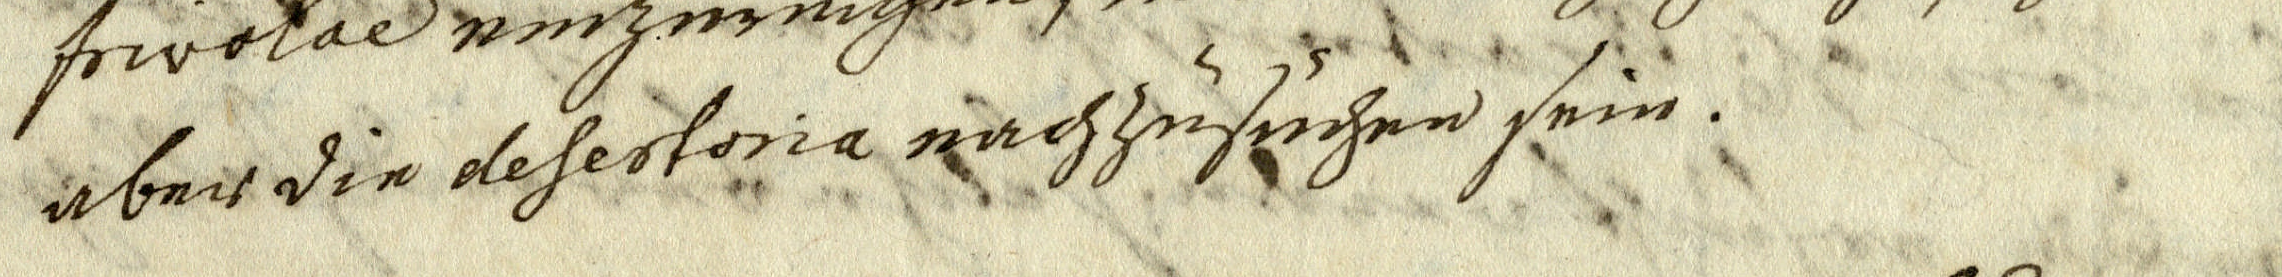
aber die desertoria nachzusuchen sein.
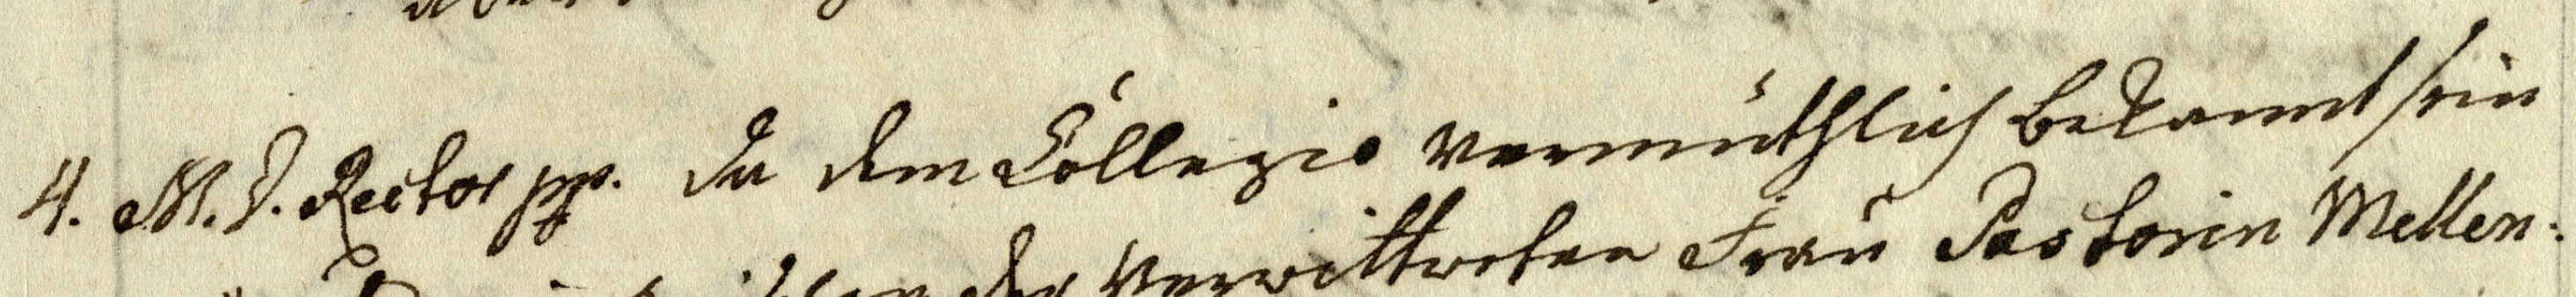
4. M. D. Rector pp. Da dem Collegio vermuthlich bekannt sein
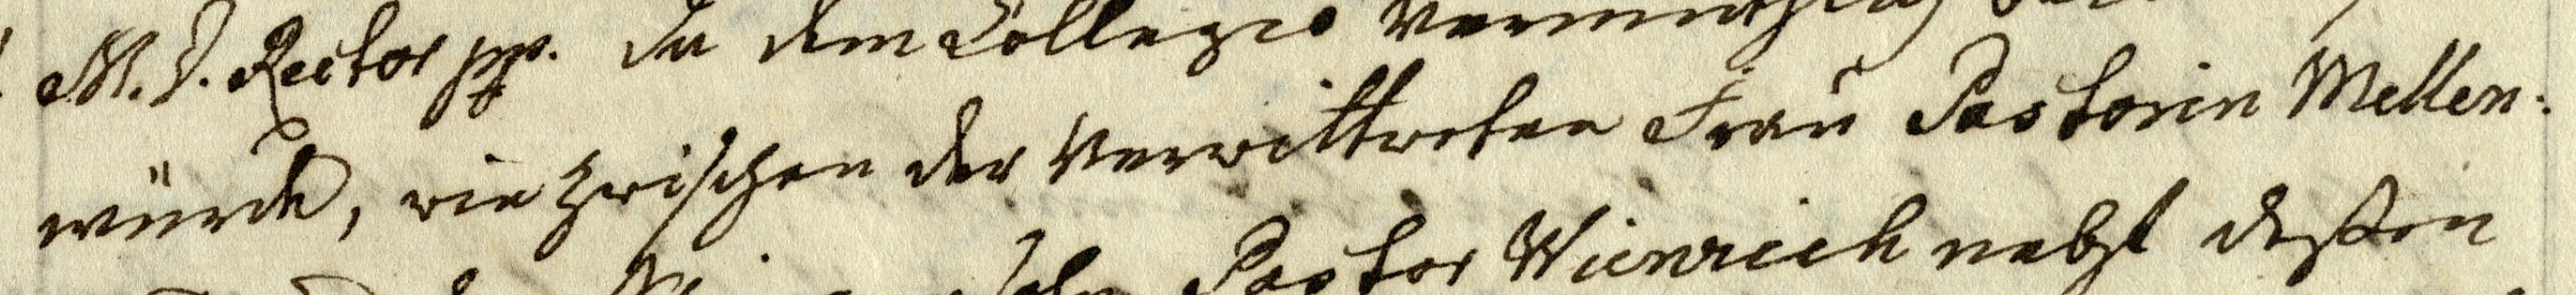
würde, wie zwischen der verwittweten Frau Pastorin Mellen¬
